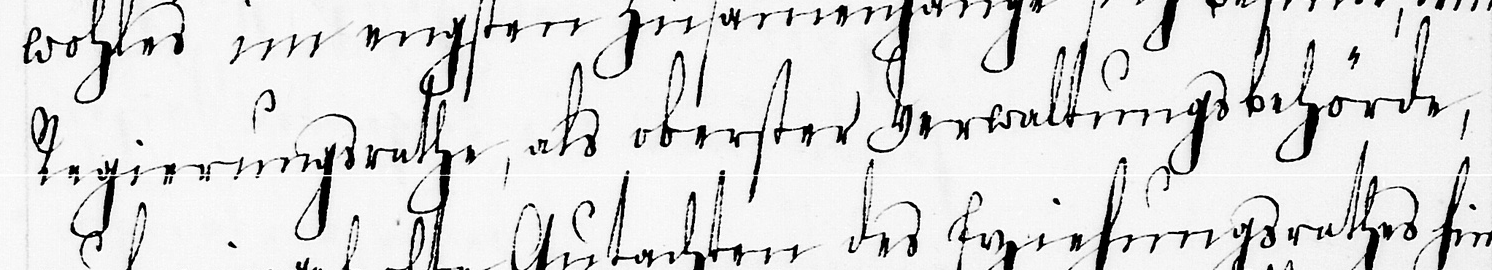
Regierungsrathe, als oberster Verwaltungsbehörde,
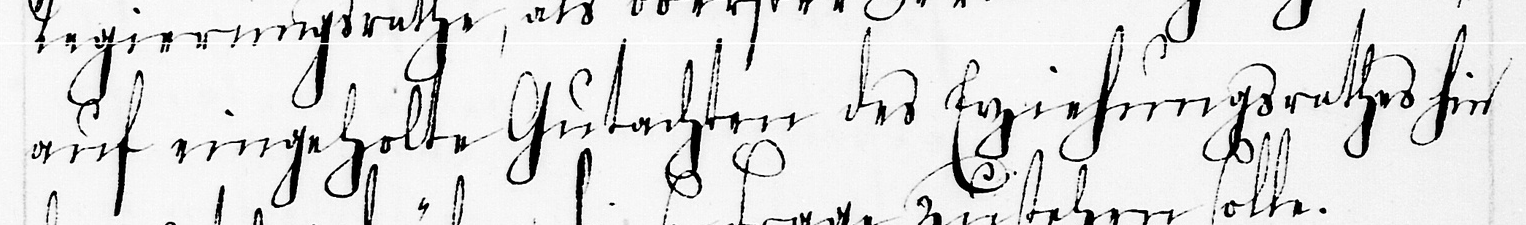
auf eingeholte Gutachten des Erziehungsrathes hin
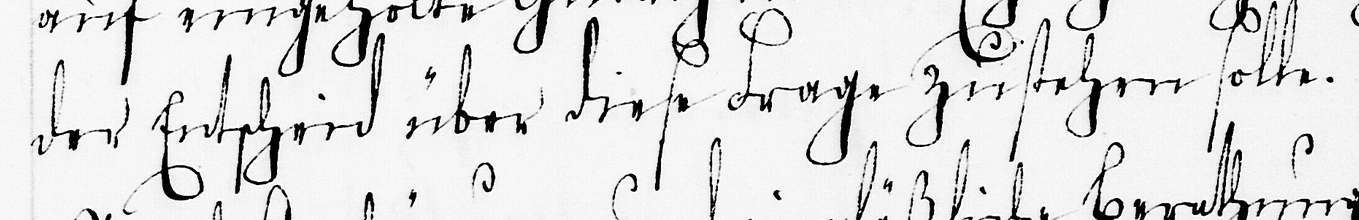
der Entscheid über diese Frage zustehen solle.
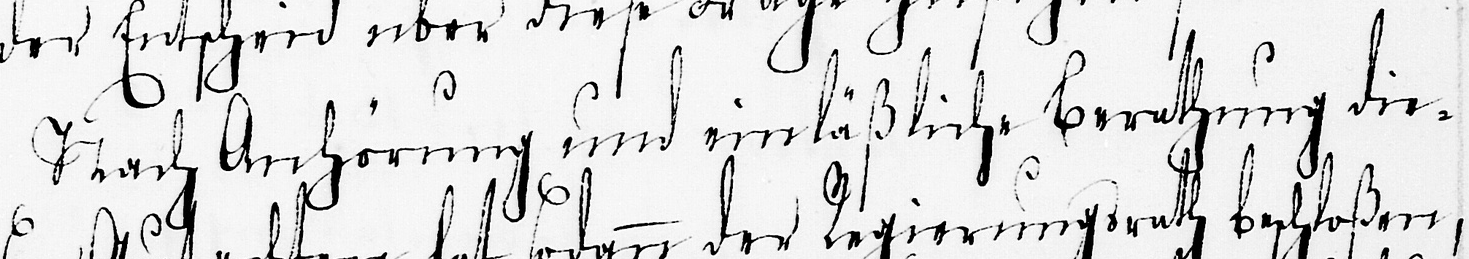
Nach Anhörung und einläßliche Berathung die¬
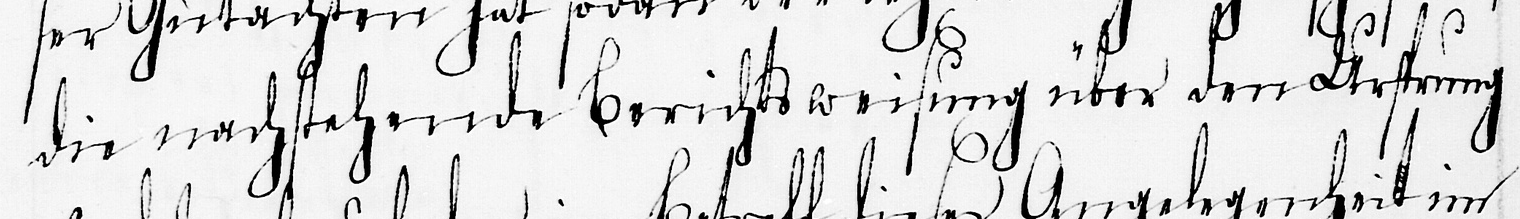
die nachstehende Berichtsweisung über den Ursprung
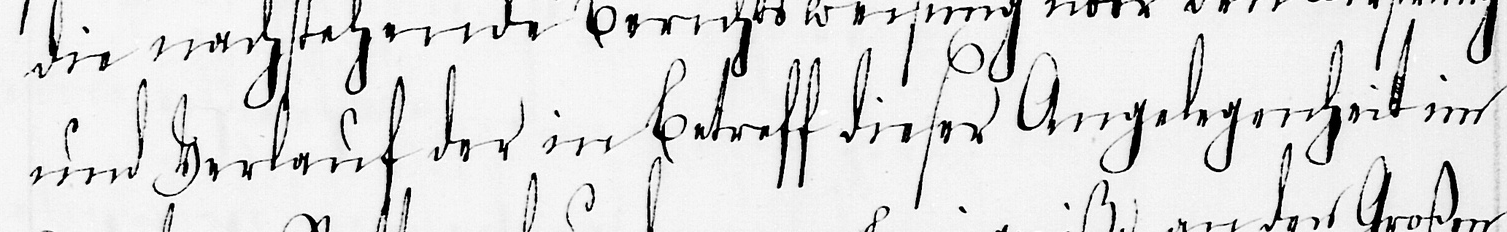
und Verlauf der in Betreff dieser Angelegenheit im
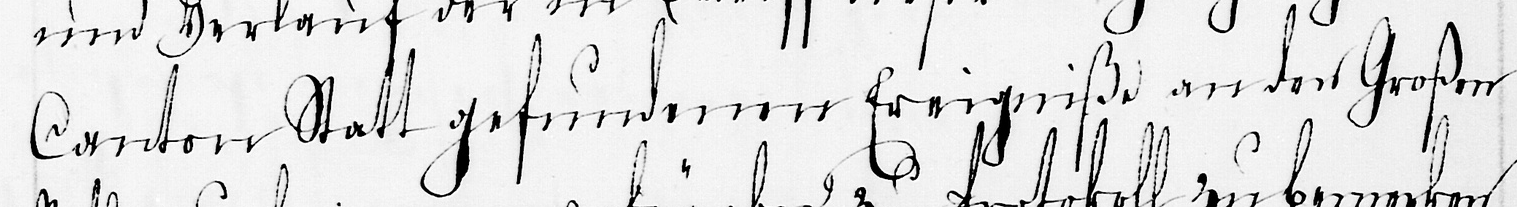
Canton Statt gefundenen Ereigniße an den Großen
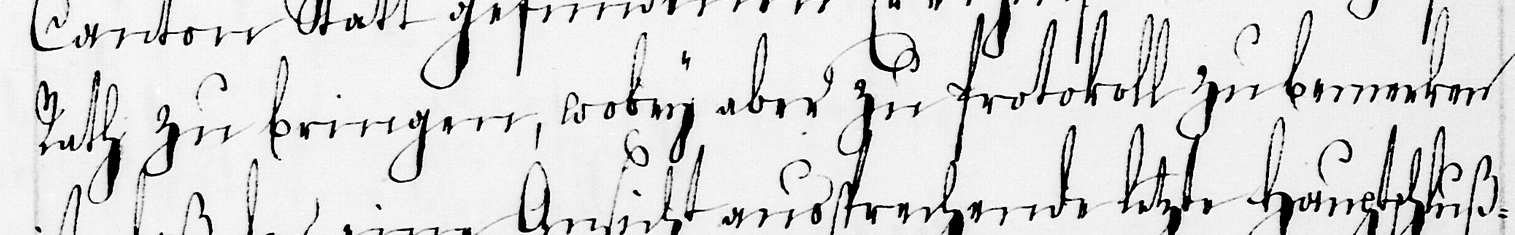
Rath zu bringen, wobey aber zu Protokoll zu bemerken
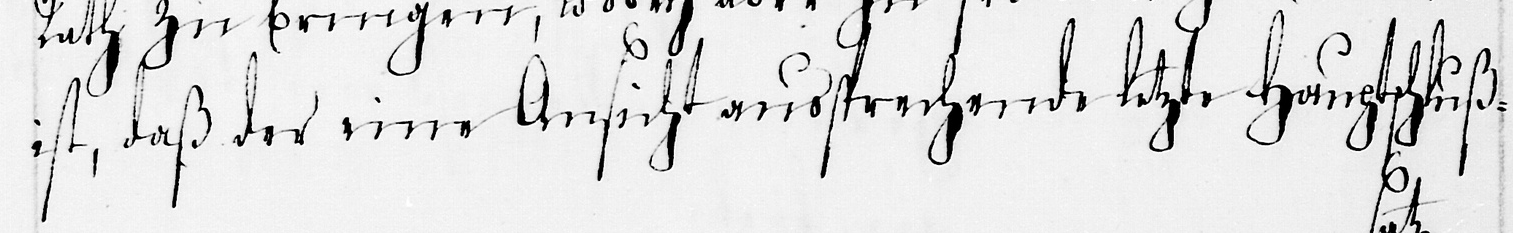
t, daß der eine Ansicht aussprechende letzte Hauptschluß-
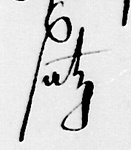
is¬
